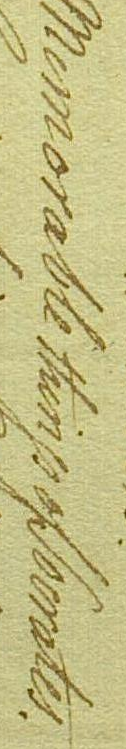Memorable things of Socrates.
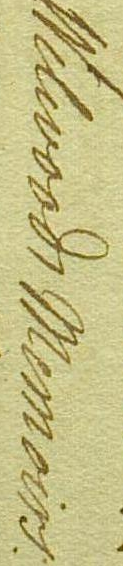Welwood's Memoirs.
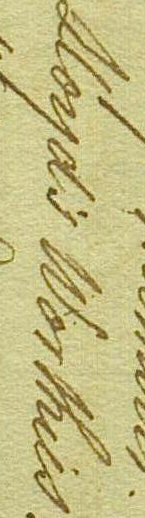Lloyd's Worthies
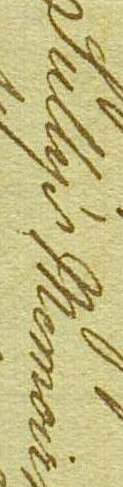Sully's Memoirs
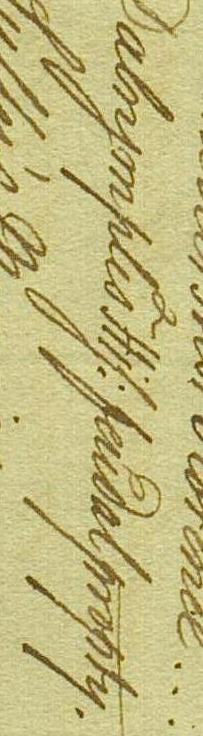Dalrymples ^2 His: feudal propty.
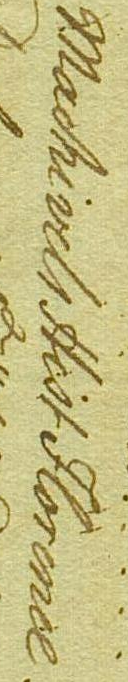Machivels Hist Florence
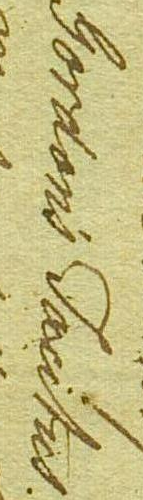Gordon's Tacitus
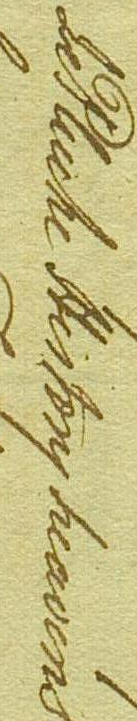LePluche History heavens.
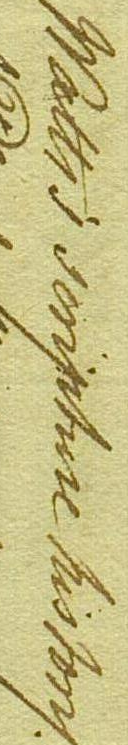Watt's scripture history.
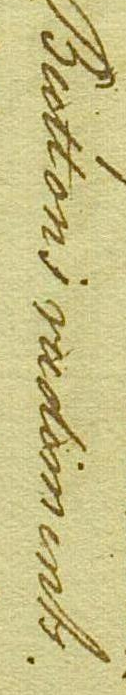Button's rudiments.
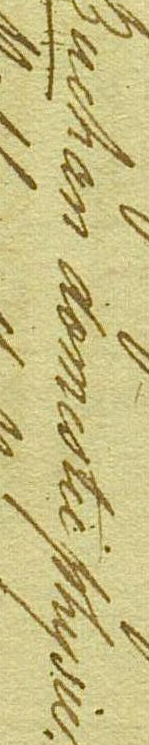Buchan domestic physics.
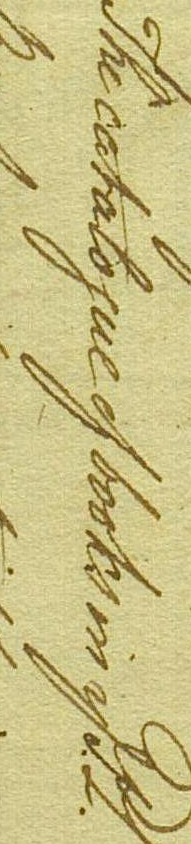The catalogue of books in y^e S.L.
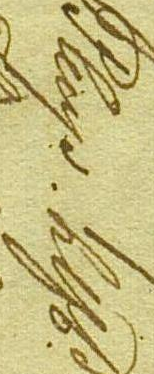Plays. hist^d
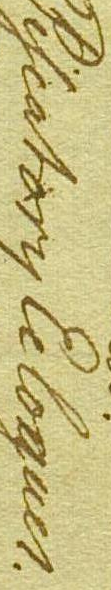Piscatory Eclogues.
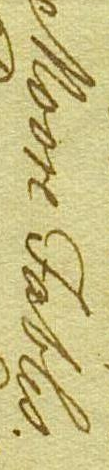Moore Fables.
